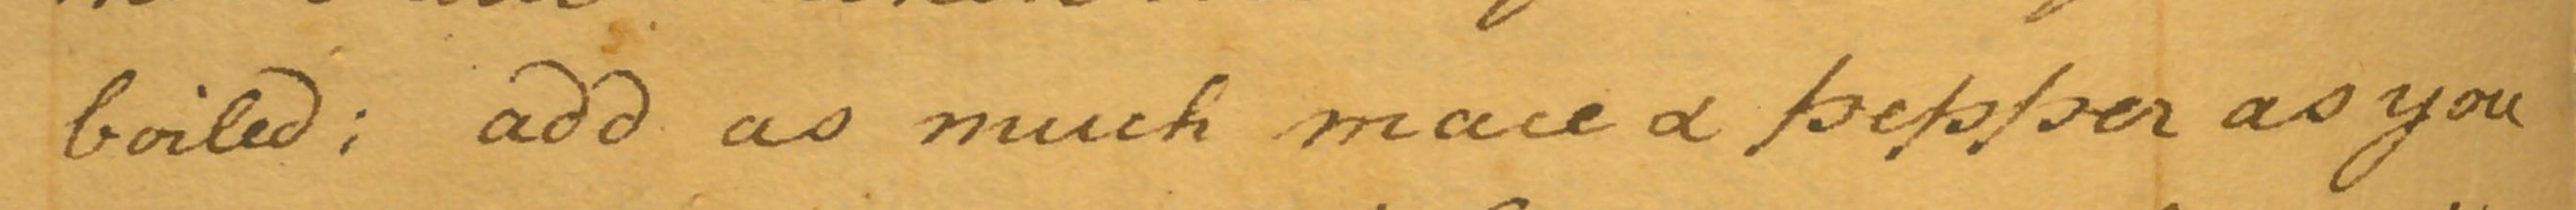boiled; add as much mace & pepper as you
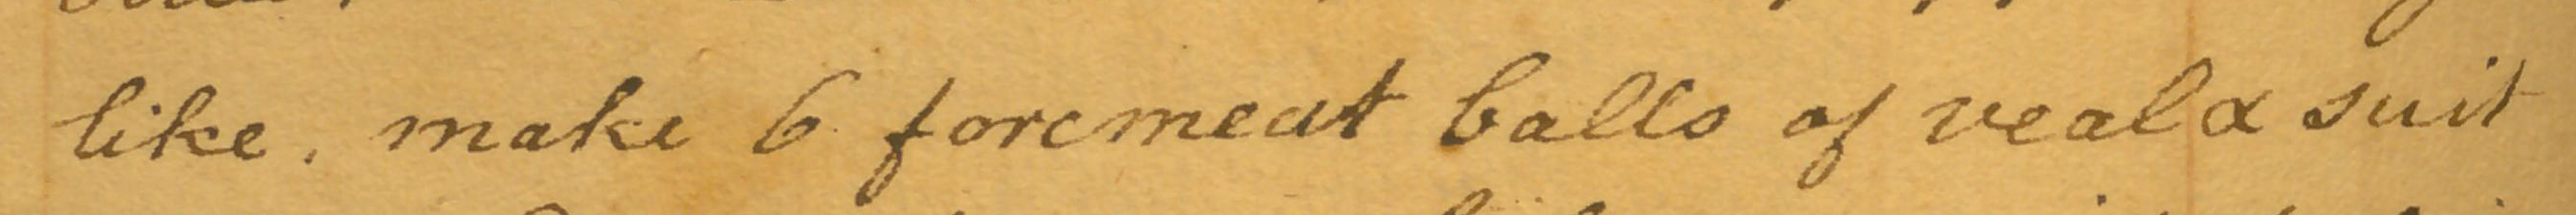like, make 6 forcmeat balls of veal & suit
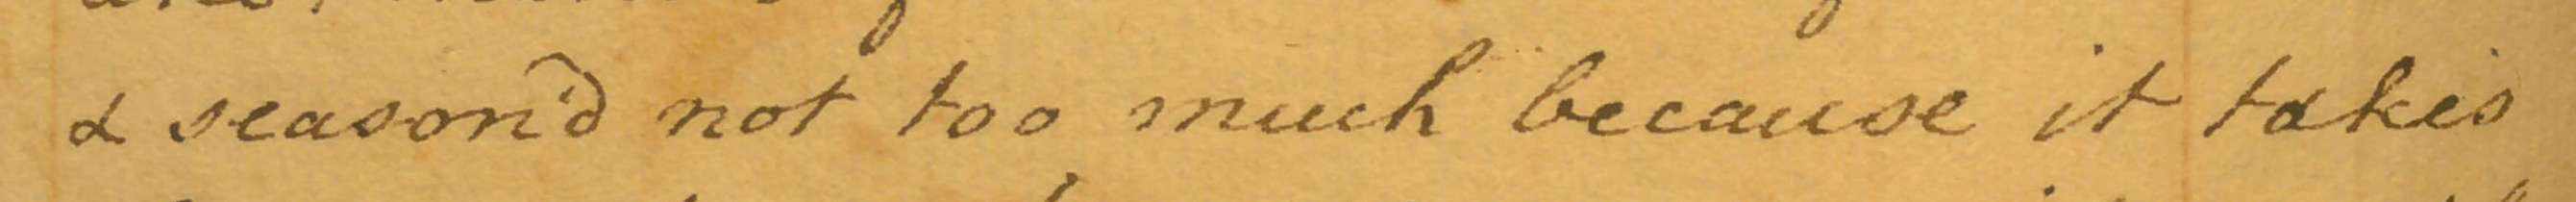& season'd not too much because it takes
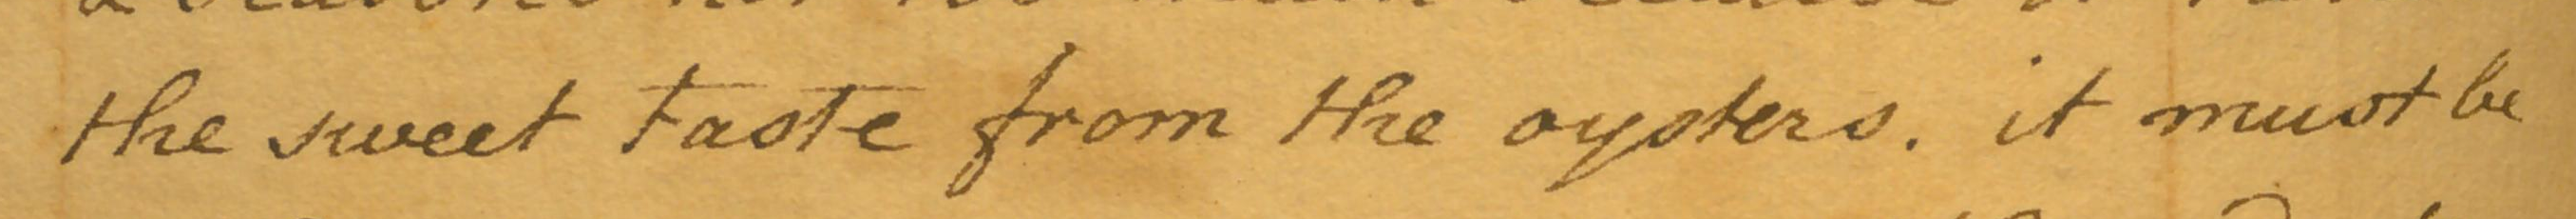the sweet taste from the oysters. it must be
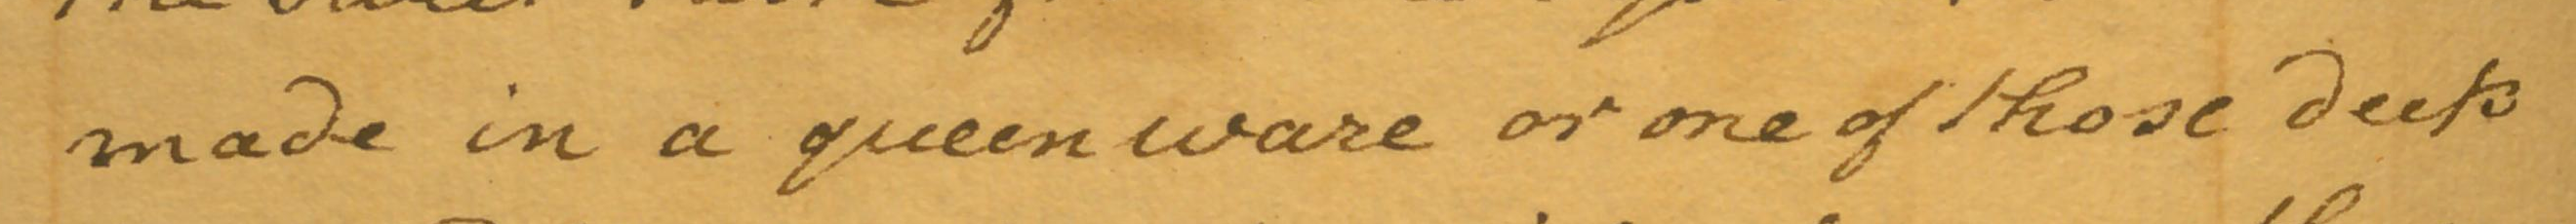made in a queenware or one of those deep
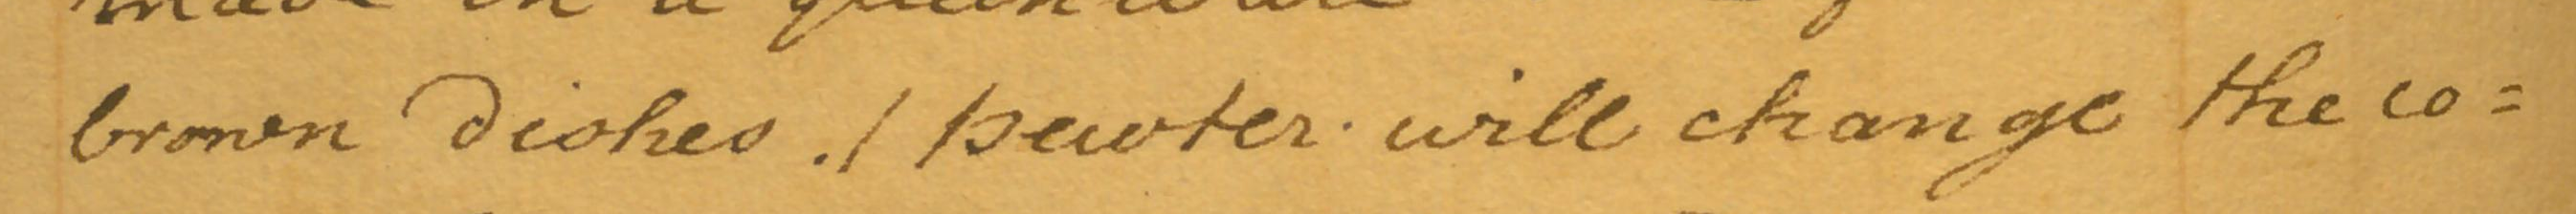brown dishes. /pewter will change the co-
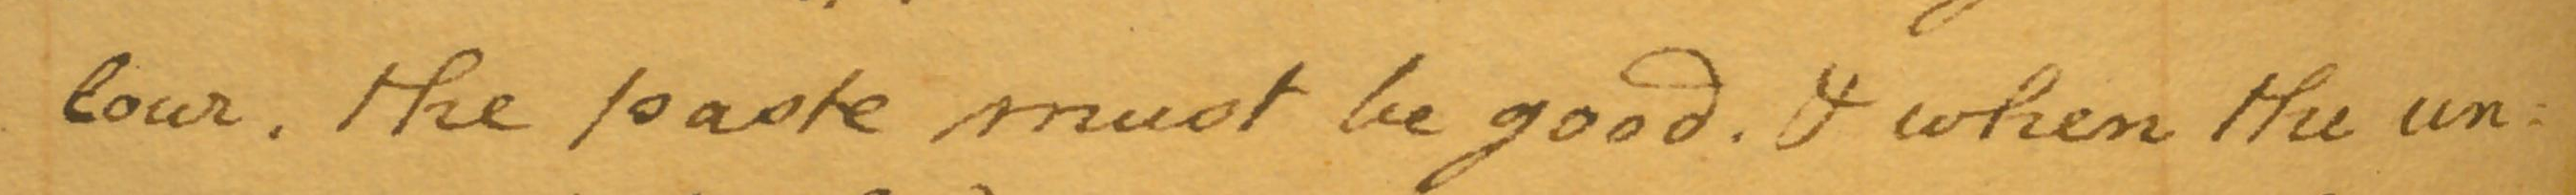lour. the paste must be good. & when the un-
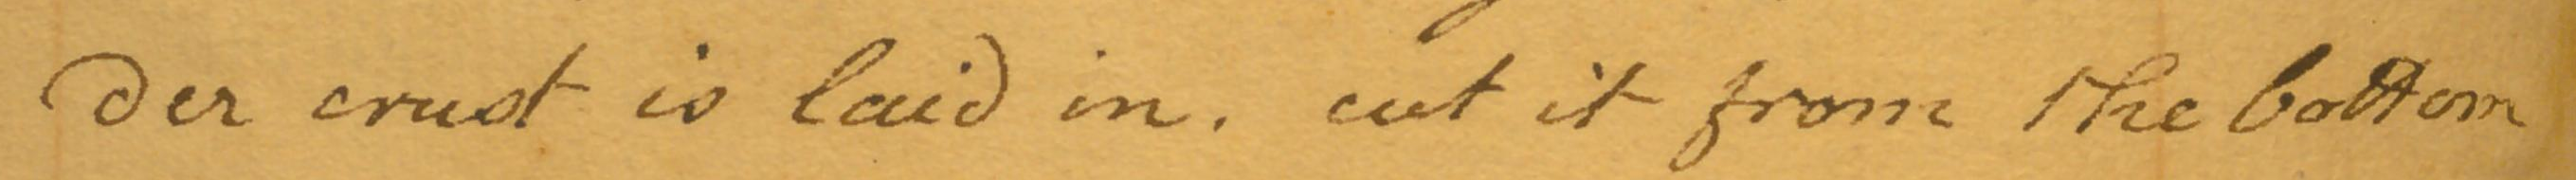der crust is laid in, cut it from the bottom
